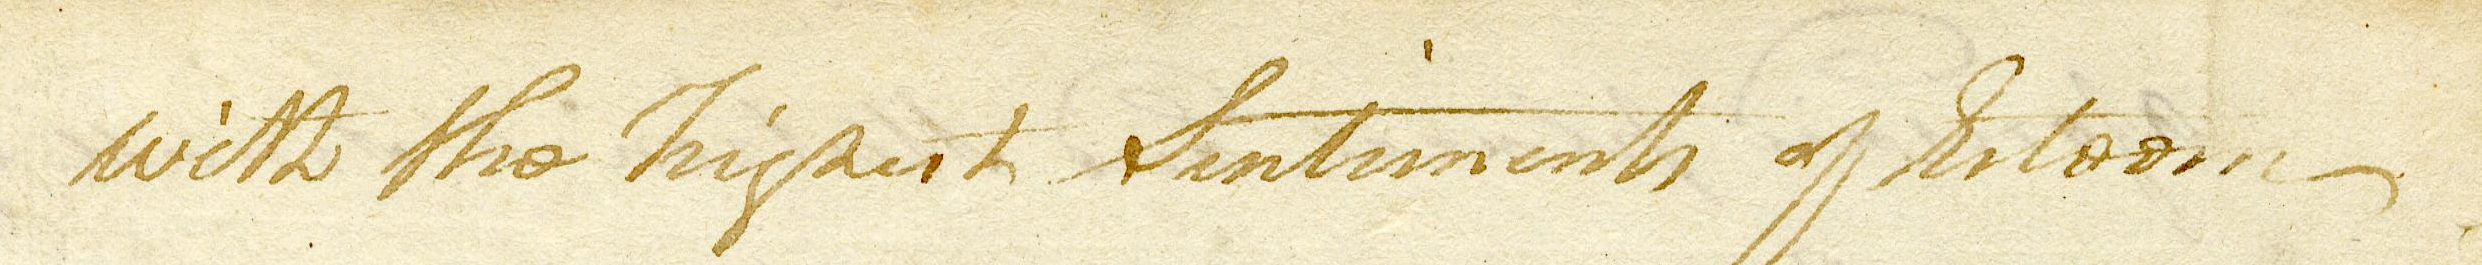with the highest Sentiments of Esteem-
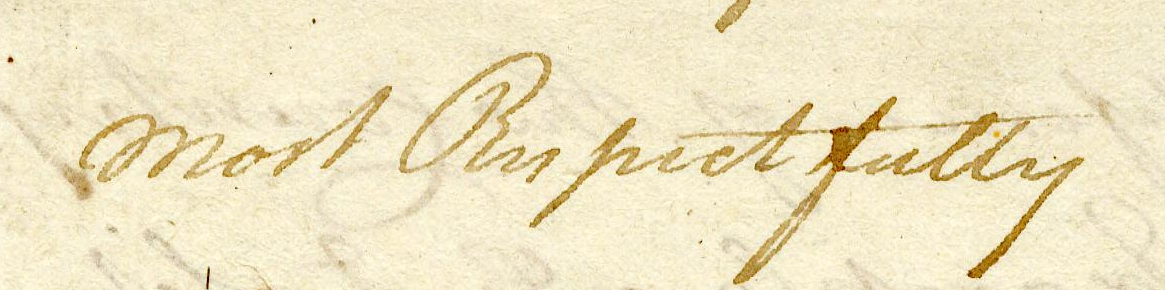most Respectfully
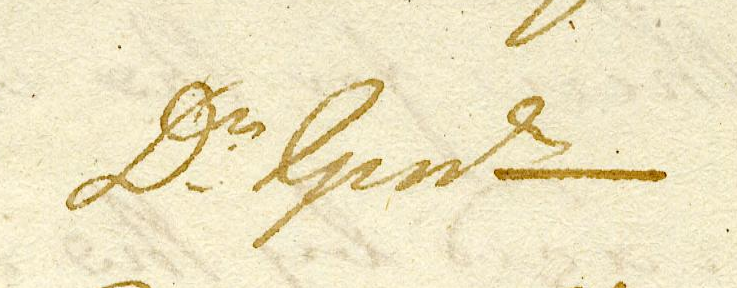D^r. Gen^l-
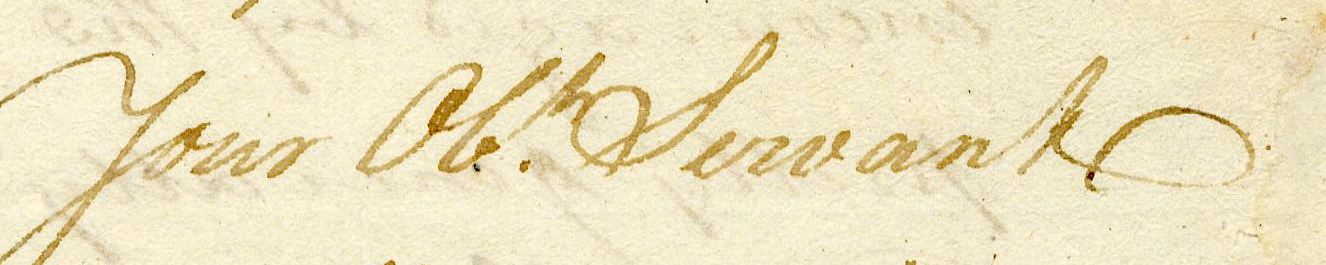Your Ob^t. Servant
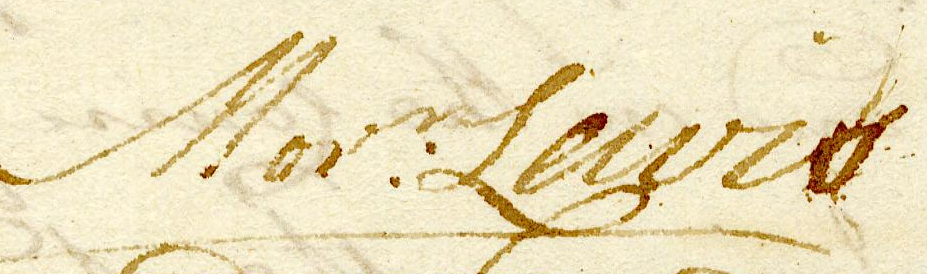Mor^n: Lewis
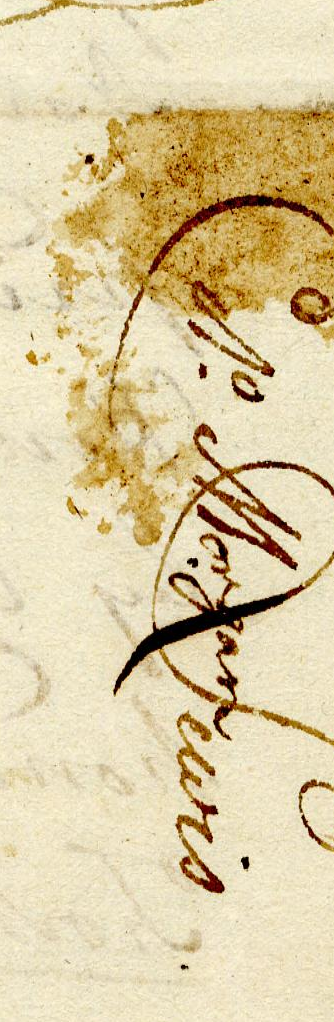Col^o. Morgan Lewis
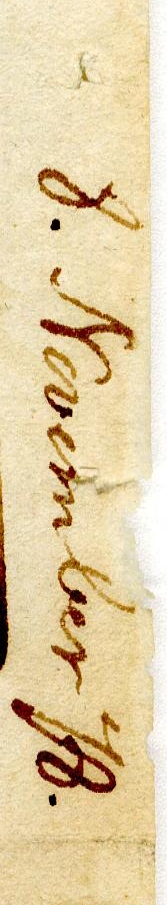8. November 78.
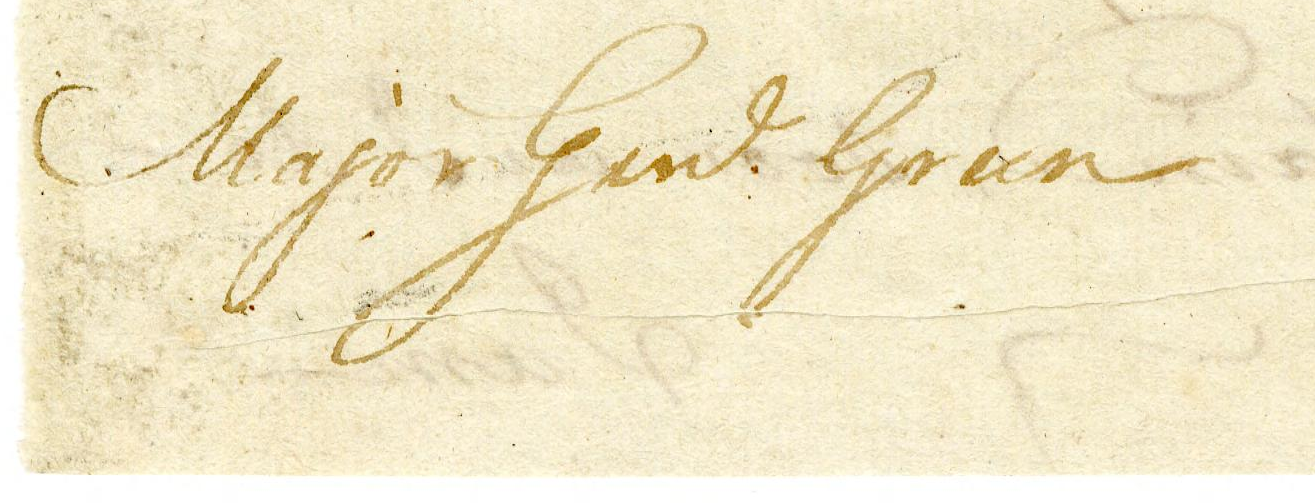Major Gen^l. Green
